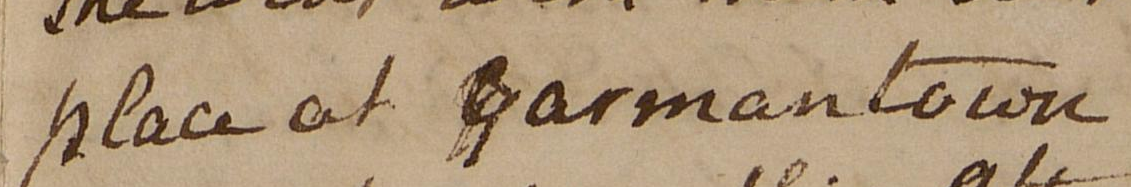place at Garmantown
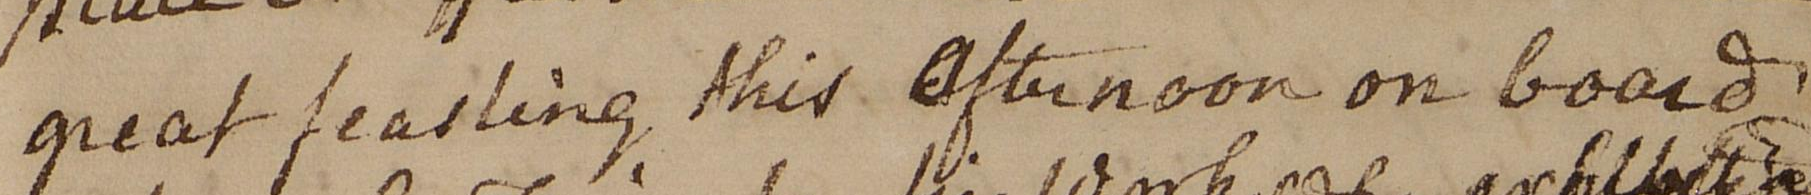great feasting this afternoon on board
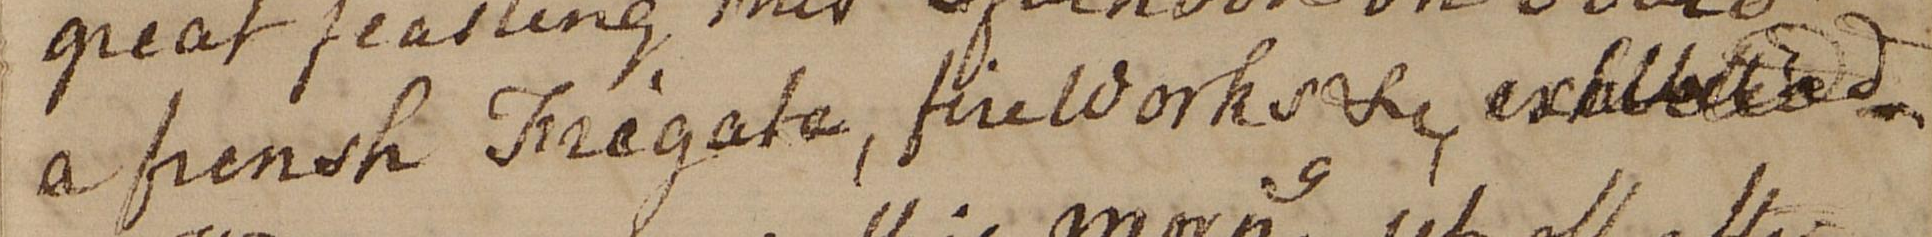a frensh Frigate, fire works &c exhibited
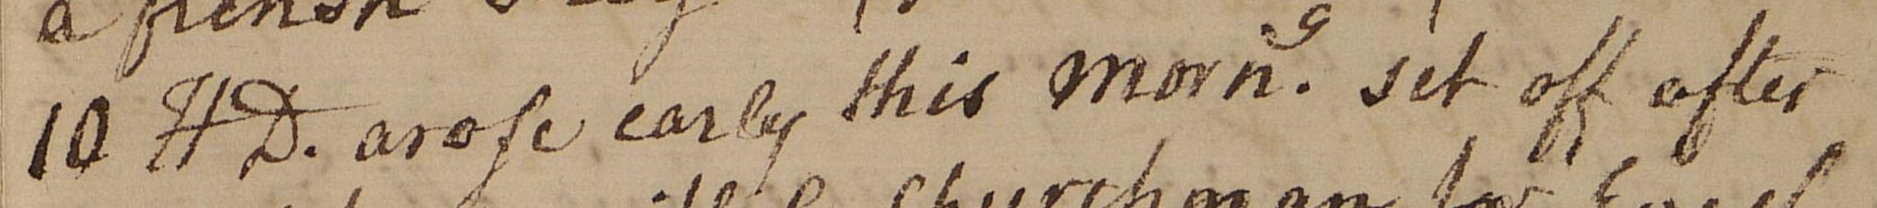10 HD. arose early this morn^g. set off after
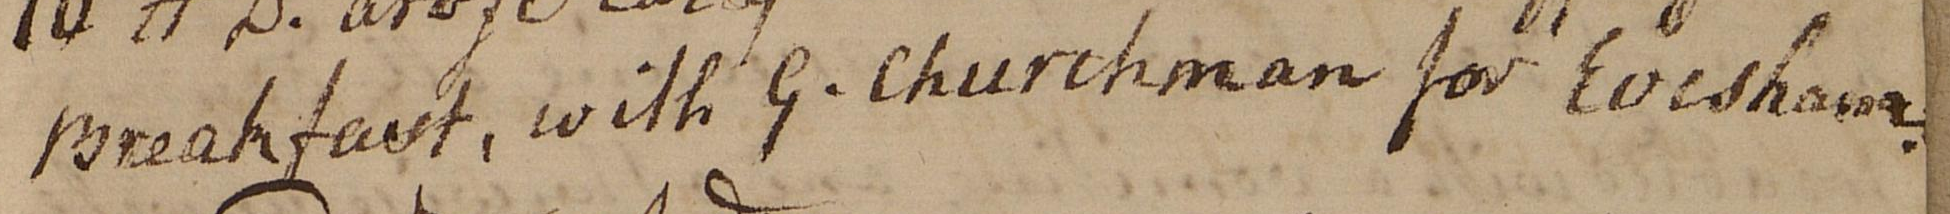Breakfast, with G. Churchman for Evesham
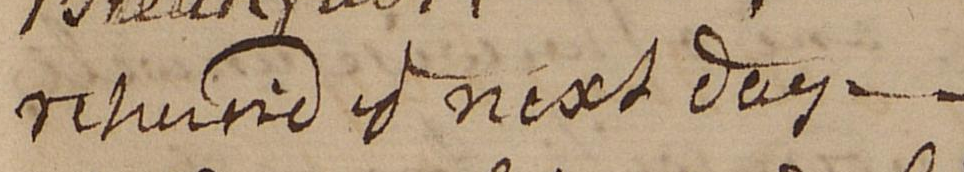return'd y^e next day-
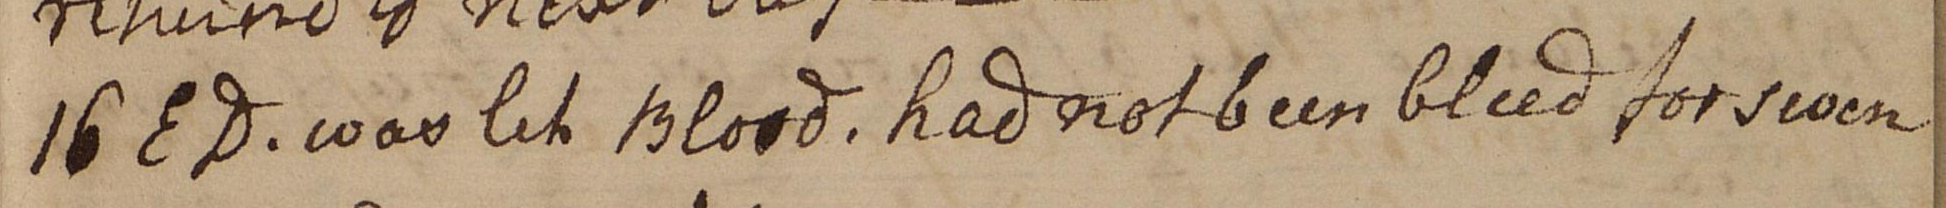16 ED. was let blood, had not been bleed for seven
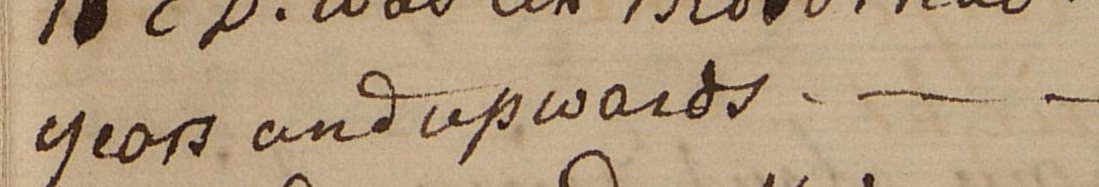years and upwards.-
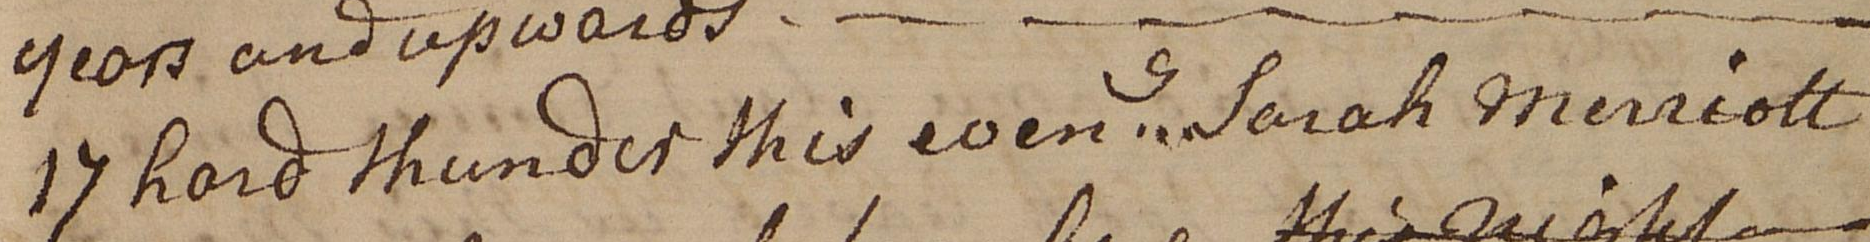17 hard thunder this even^g Sarah Merriott
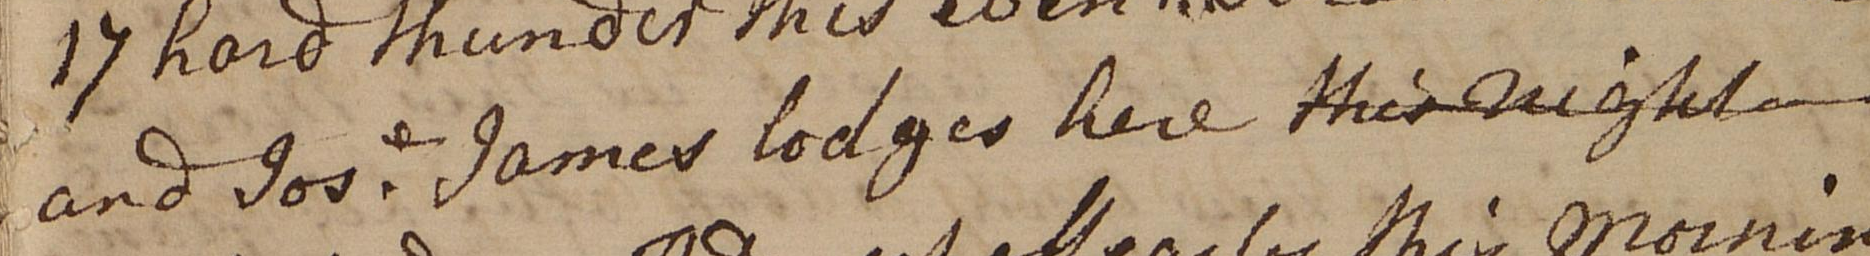and Jos^a. James lodges here this Night-
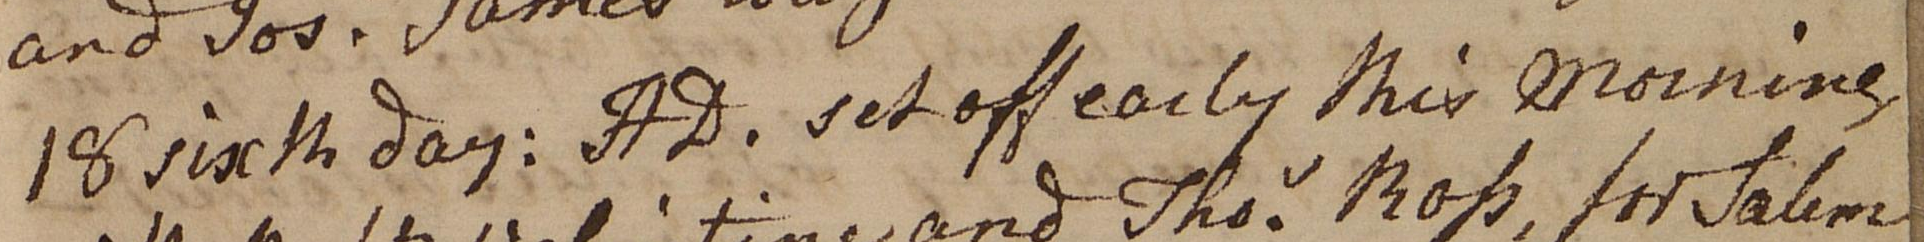18 sixth day: HD. set off early this morning
